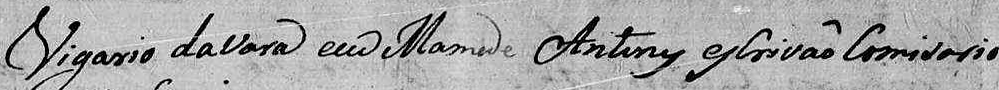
Vigario da Vara e eu Mamede Antunes esCrivaõ Comisario
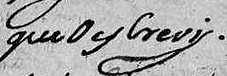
que o esCrevy.
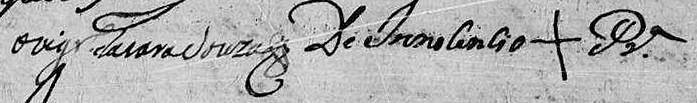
o vigr.o da vara souza De InnoCenCio + Pr.a
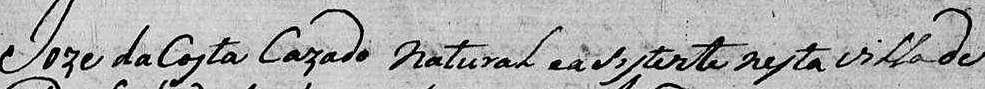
Ioze da Costa Cazado natural e asistente nesta villa de
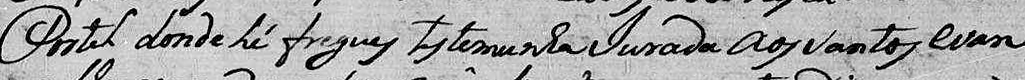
Portel donde hé fregues testemunha Iurada aos santos evan
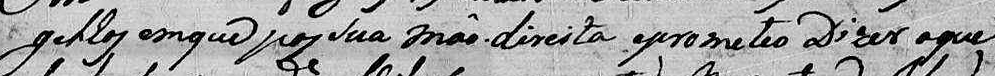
gelhos em que pos sua maõ. direita e prometeo Dizer o que
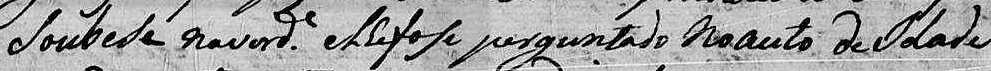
Soubese na verd.e e lhe fose perguntado no auto de Idade
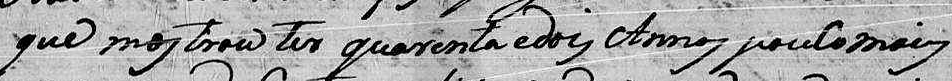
que mostrou ter quarenta e dois Annos pouCo mais
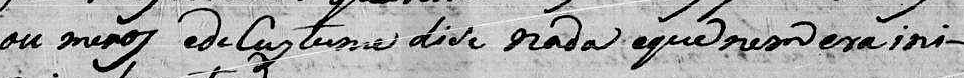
ou menos e de Custume dise nada e que nem era ini
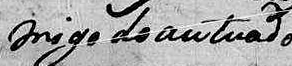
migo do autuado
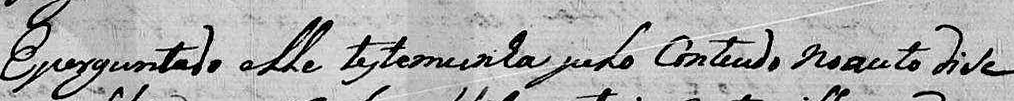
E perguntado elle testemunha pelo Conteudo no auto dise
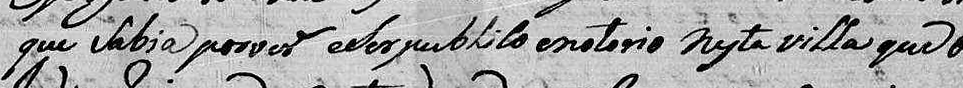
que Sabia por ver e ser publiCo e notorio nesta villa que o
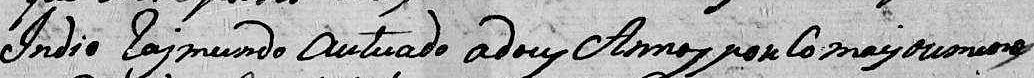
Indio Rajmundo Autuado a dous Annos pouCo mais ou menos
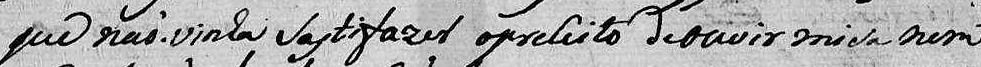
que naõ vinha Sastifazer o preCeito de ouvir misa nem
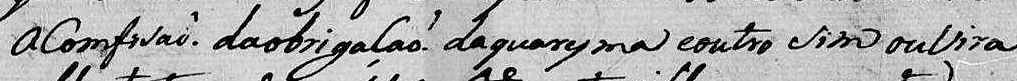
A Comfisaõ. da obrigaçaõ da quaresma e outrosim ouvira
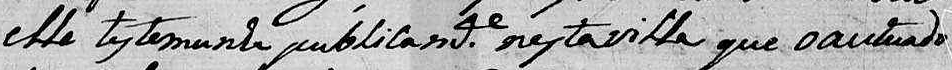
elle testemunha publicam.te nesta villa que o autuado
